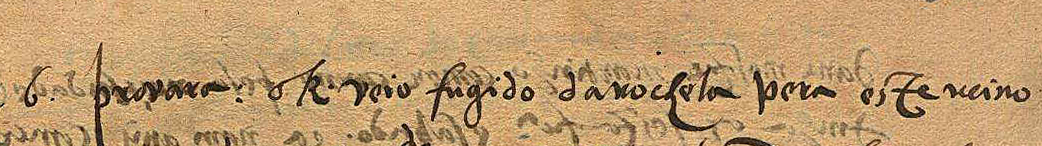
6. prouara o Re veio fugido da rochela pera este reino
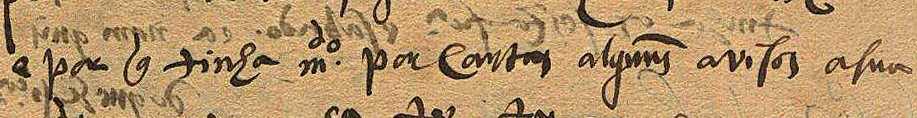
e porq̄ tinha mdo. por Carta alguūs avisos a sua
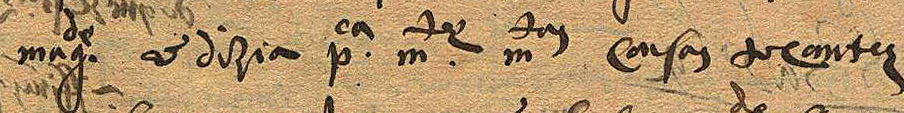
mag.de & dizia pca.mte mtas Cousas tocantes
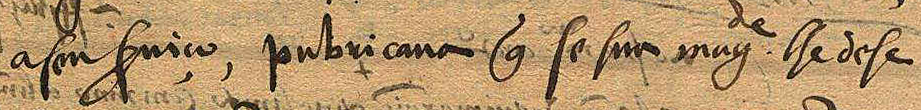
a seu ꞩuiço, pubricaua q̄ se sua mag.de lhe dese
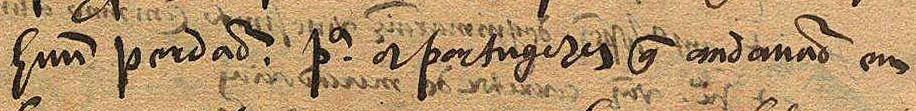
huū perdão p.a os portugezes q̄ andauão em
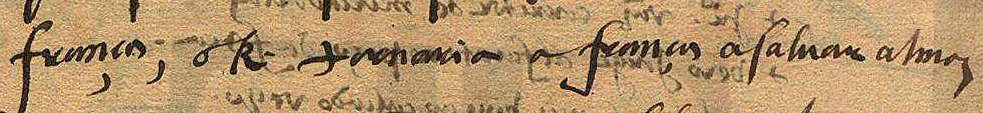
frança, o R. tornaria a frança a saluar almas
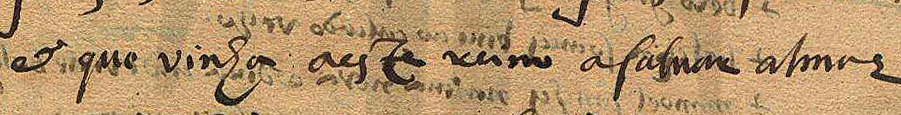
& que vinha a este reino a saluar almas
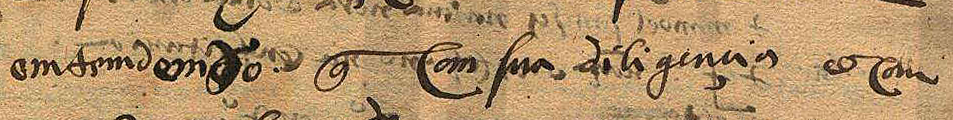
emtemdemdo q̄ Com sua diligencia & Com
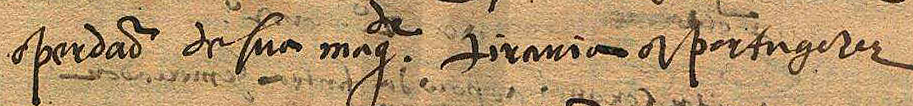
o perdão de sua mag.de tiraria os portugezes
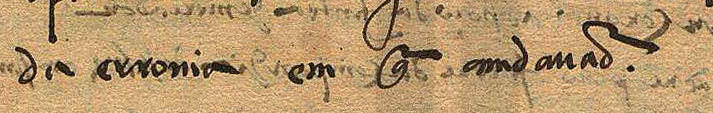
da erronia em q̄ andauão.
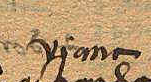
viana
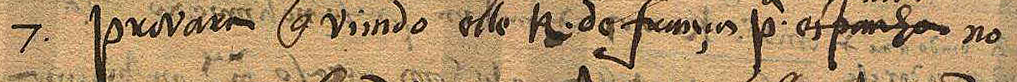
7. Provara q̄ vimdo elle R. de frança pa espanha no
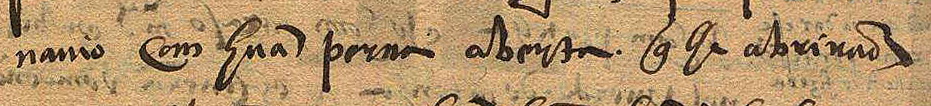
nauio Com huā perna aberta q̄ he abrirão
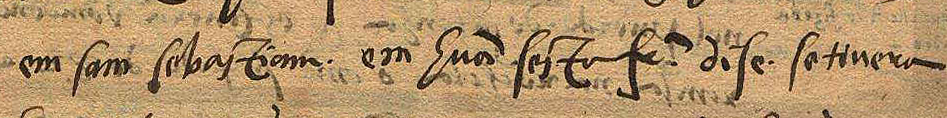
em sam sebastiam em huā sesta fra. dise. se tiuera
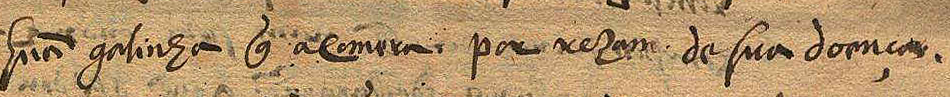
huā galinha q̄ a Comera por rezam de sua doença.
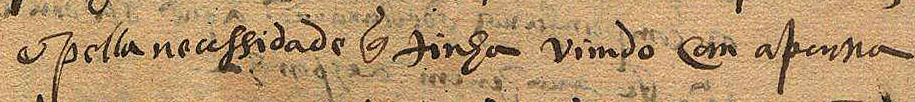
e pella necessidade q̄ tinha vimdo Com a perna
